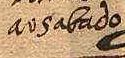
ao sabado
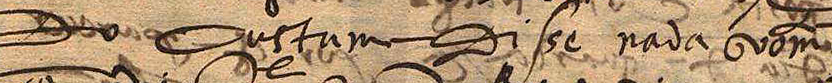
Do Custume Disse nada soomte
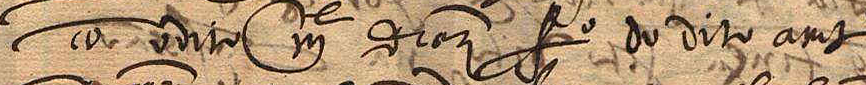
c̄o o dito mel diaz fo do dito amto
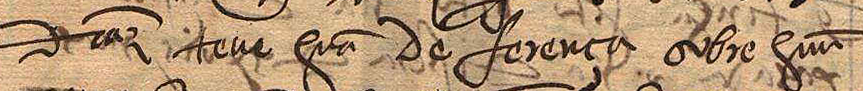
diaz teue huā deferença sobre hu̅u
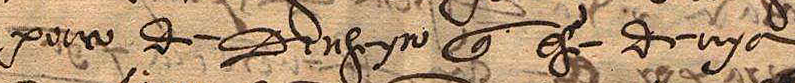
pouco de Dinheyro q̄ lhe deuya
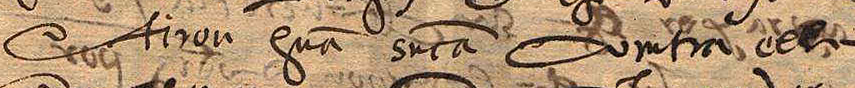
e tirou huā snc̄a Comtra elle
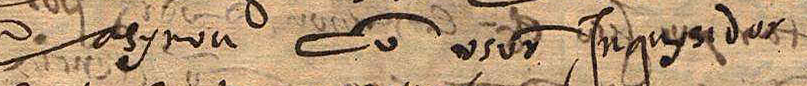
e asynou Cō o sor̄ Jnquysidor
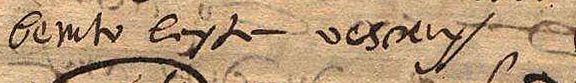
bemto leyte o escrevy /
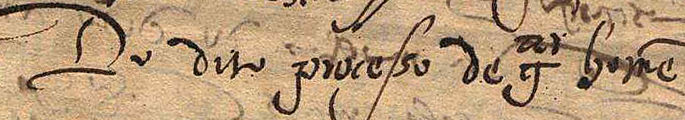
Do dito processo de gar homē
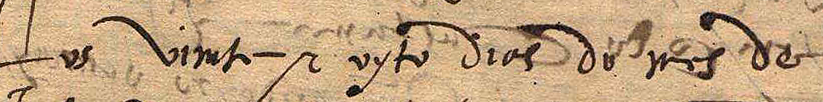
Aos vimte e oyto dias do mes de
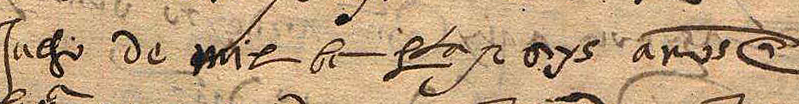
Julho de miL bc Lta e seys an̄os ē
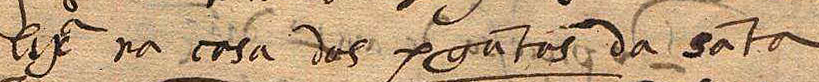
lixa na casa das ꝑgūtas da sāta
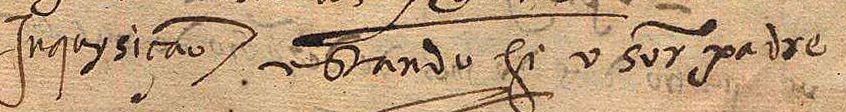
Jnquysição / estando hi o sōr padre
